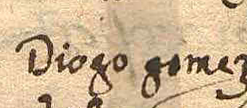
Diogo gomez
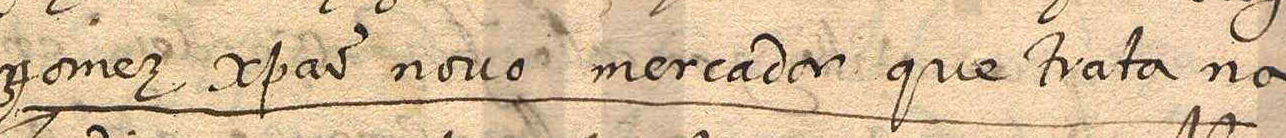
gomez xpaõ nouo mercador que trata na
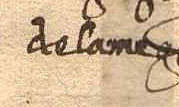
de lamego
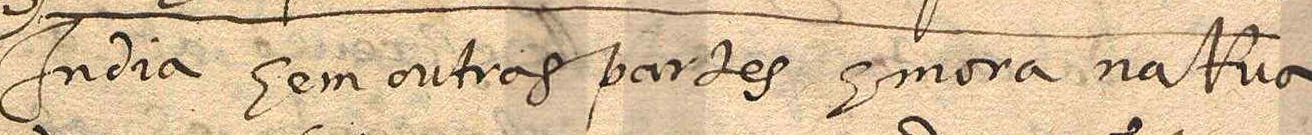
Jndia E em outras partes E mora na Rua
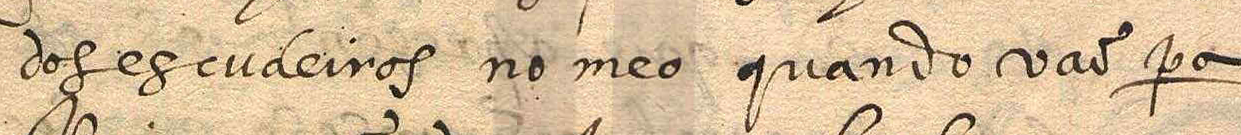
dos escudeiros no meo quando vaõ ꝑa
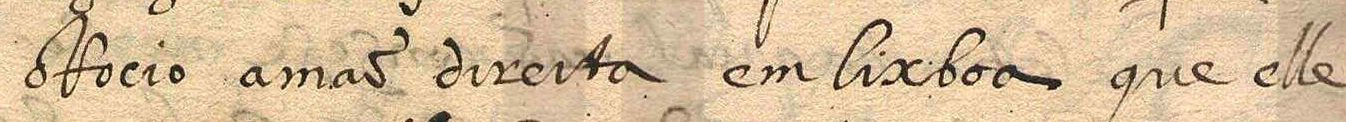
o Rocio a maõ direita em lixboa que elle
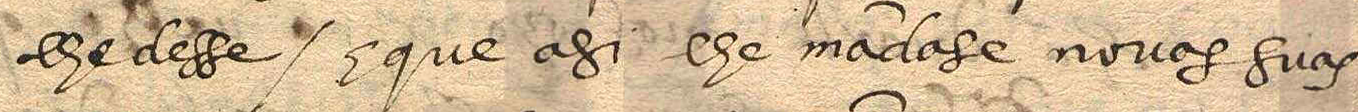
lhe desse / E que asi lhe mādase nouas suas
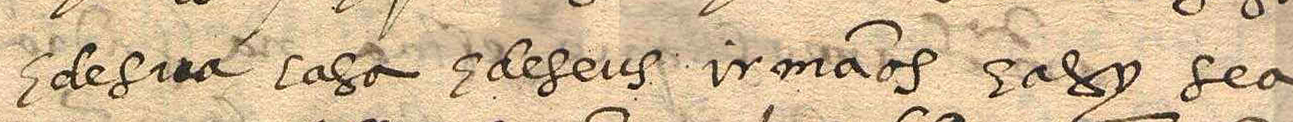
E de sua casa E de seus irmãos E asy se a
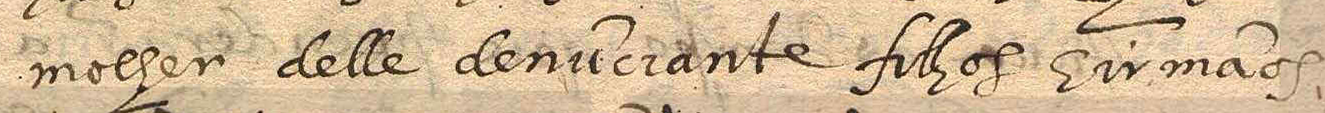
molher delle denūciante filhos E irmaõs
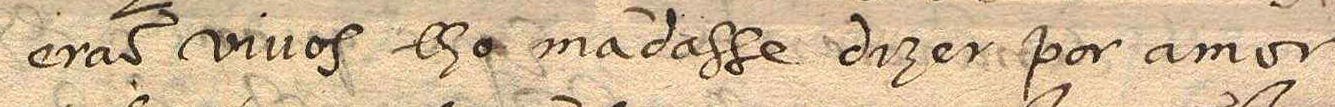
eraõ viuos lho mādasse dizer por amor
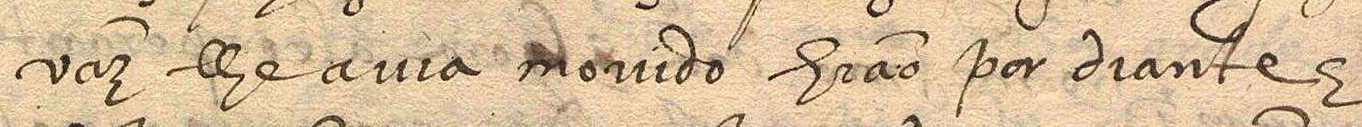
vaz lhe auia mouido hiaõ por diante E
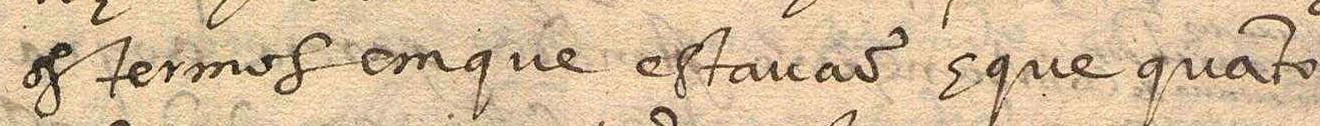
os termos em que estauaõ E que quāto
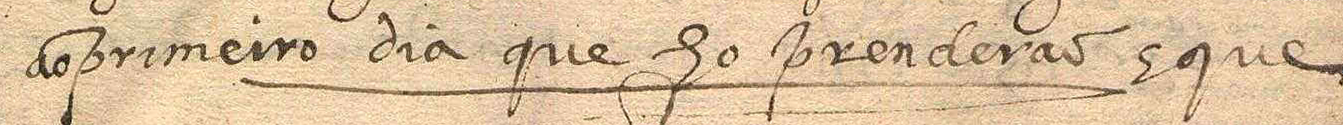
ao primeiro dia que ho prenderão E que
